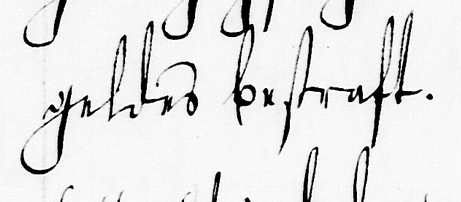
geldes bestraft.
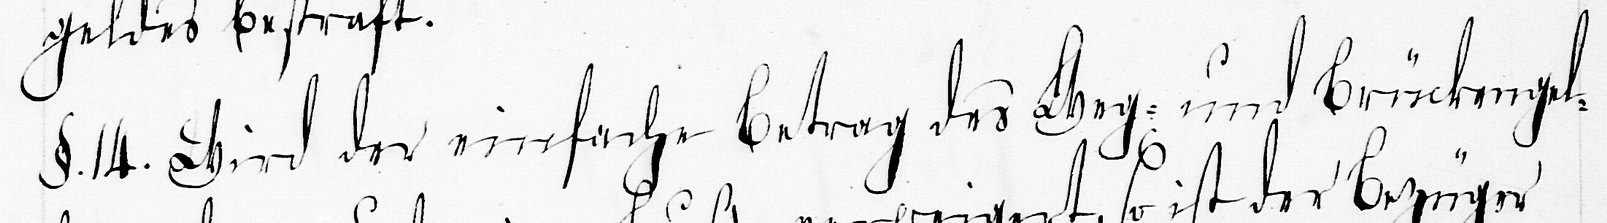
§. 14. Wird der einfache Betrag des Weg- und Brückengel¬
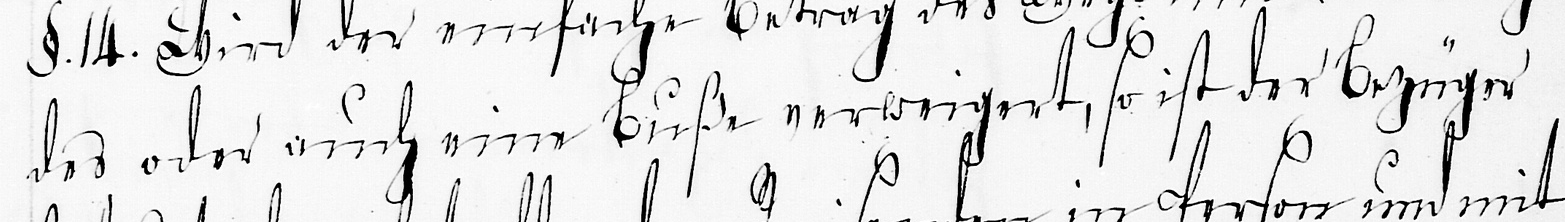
des oder auch eine Buße verweigert, so ist der Bezüger
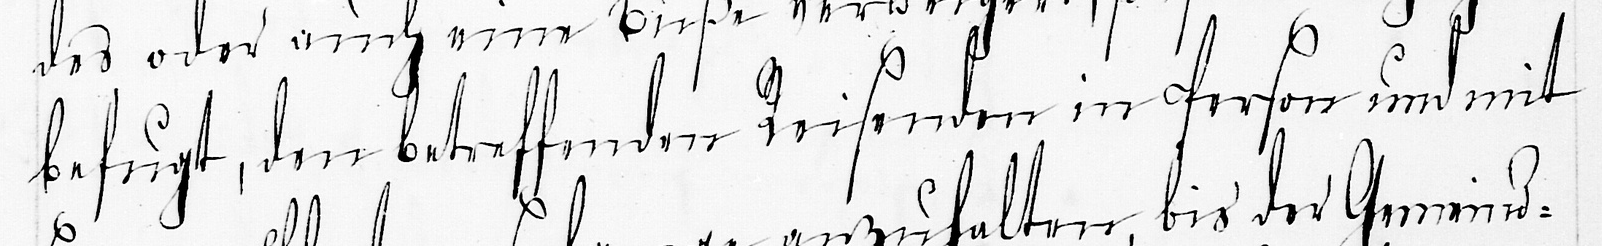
befugt, den betreffenden Reisenden in Person und mit
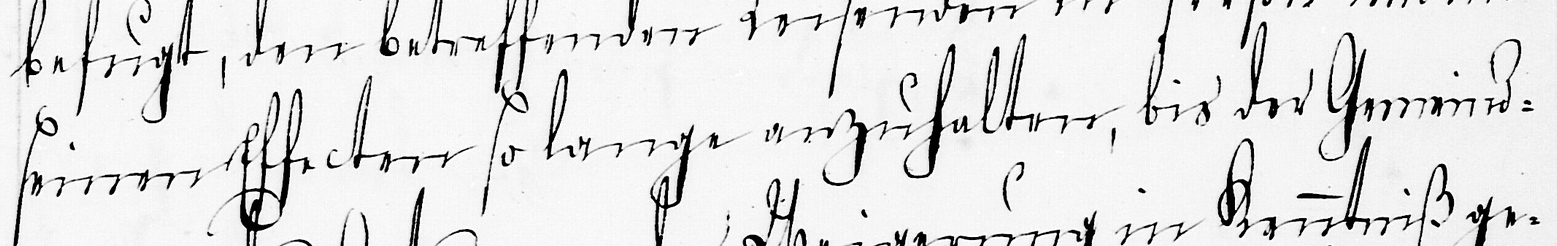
seinen Effecten so lange anzuhalten, bis der Gemeind¬
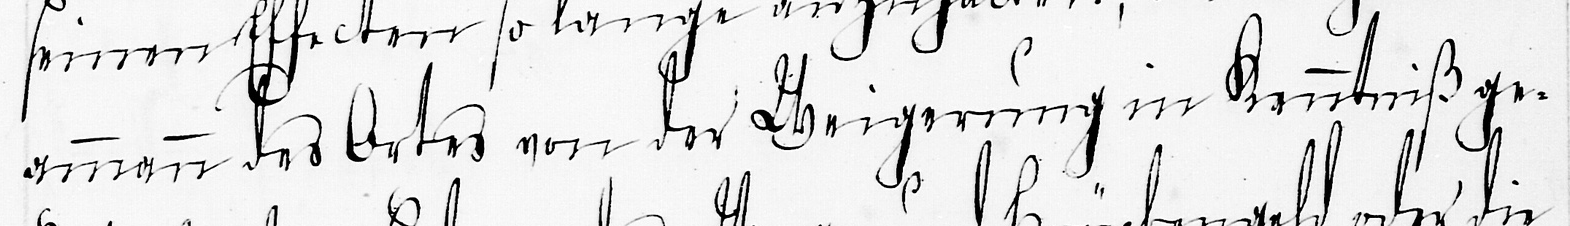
ammann des Ortes von der Weigerung in Kenntniß gese¬
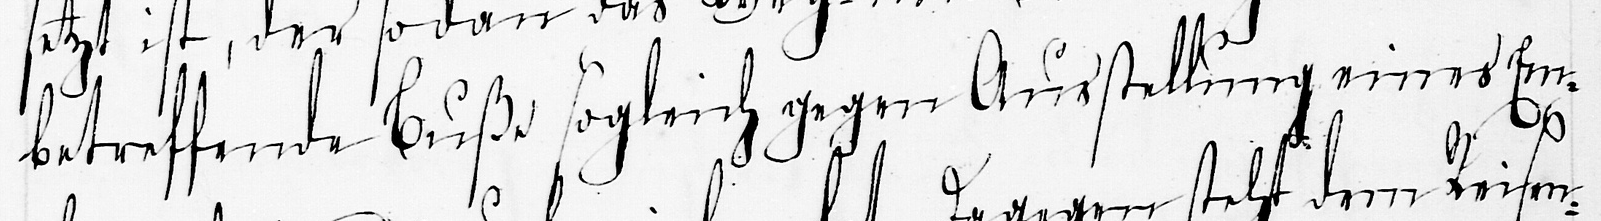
betreffende Buße sogleich gegen Ausstellung eines Em¬
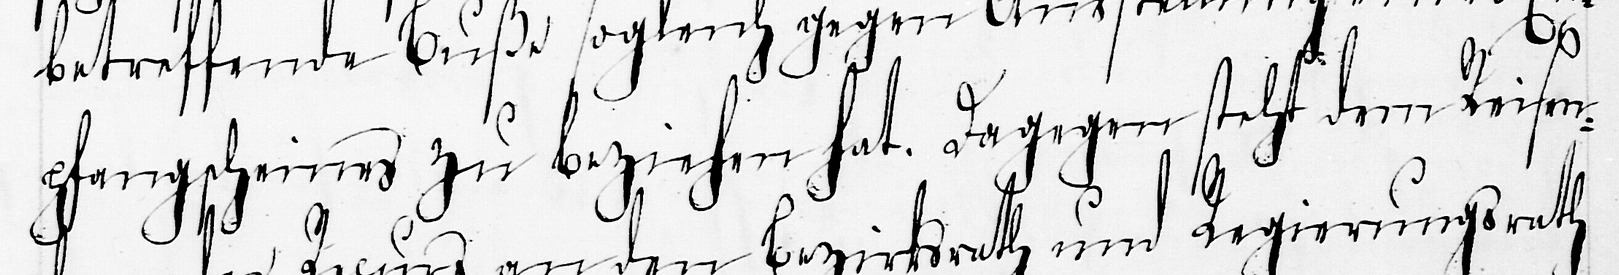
pfangsscheines zu beziehen hat. Dagegen steht dem Reisen¬
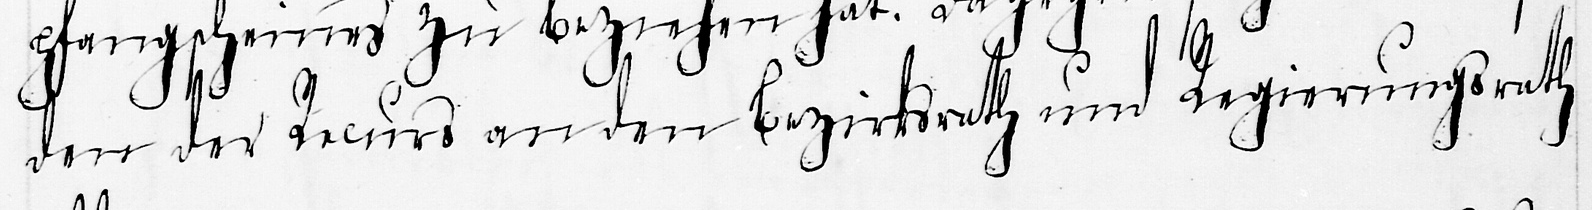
den der Recurs an den Bezirksrath und Regierungsrath
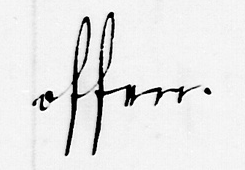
offen.
